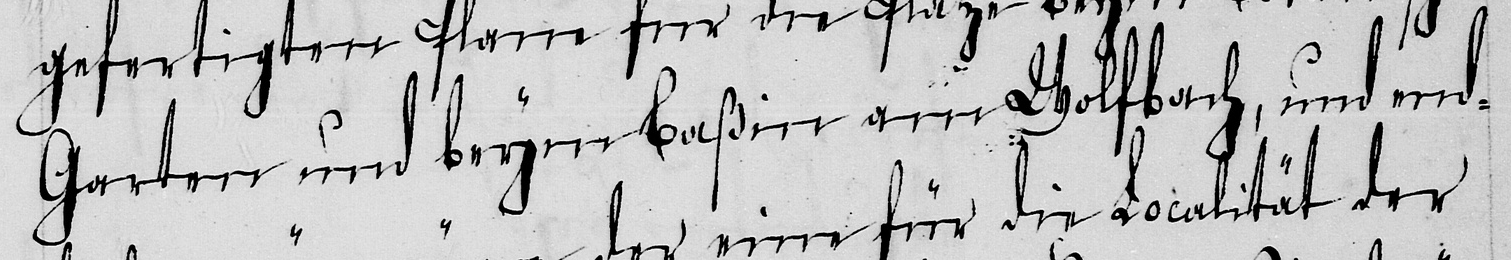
Garten und beym Baßin am Wolfbach, und end¬
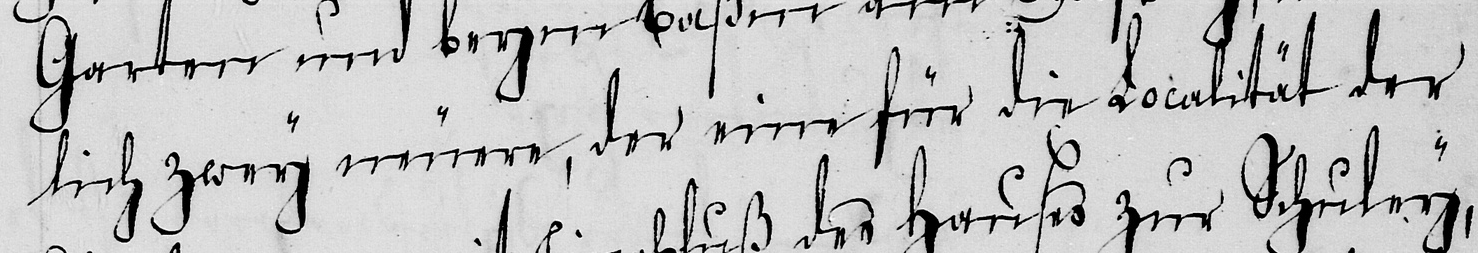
lich zwey neuere, der eine für die Localität der
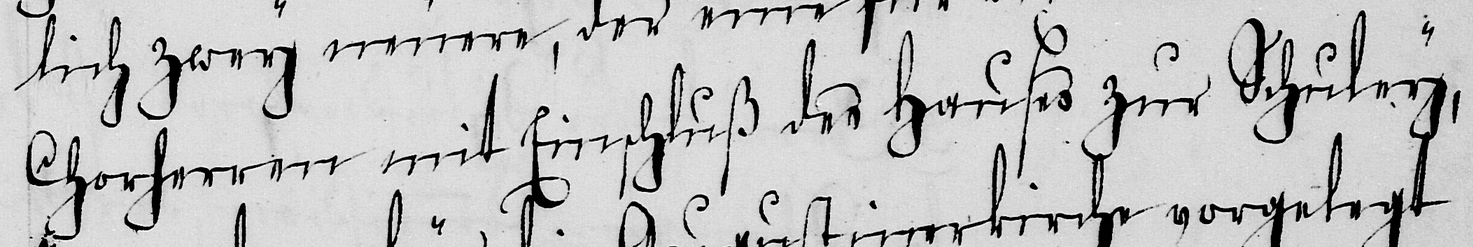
Chorherren mit Einschluß des Hauses zur Schuley,
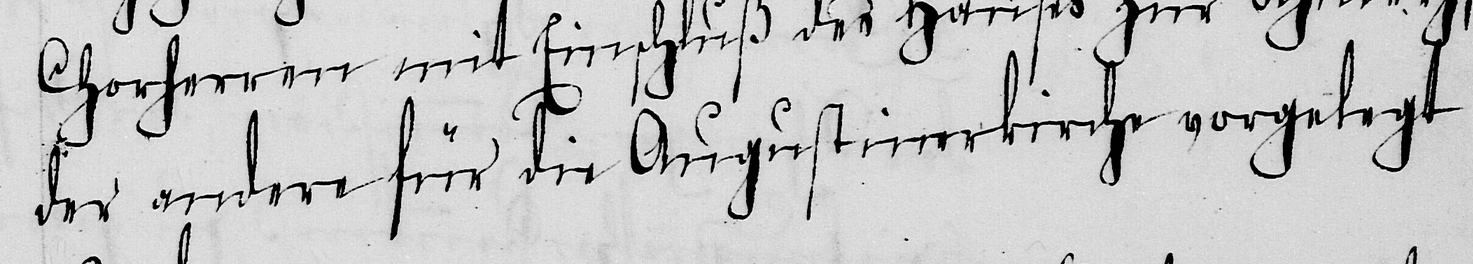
der andere für die Augustinerkirche vorgelegt
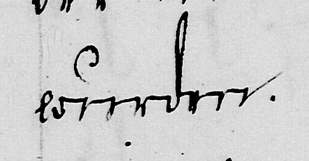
wurden.
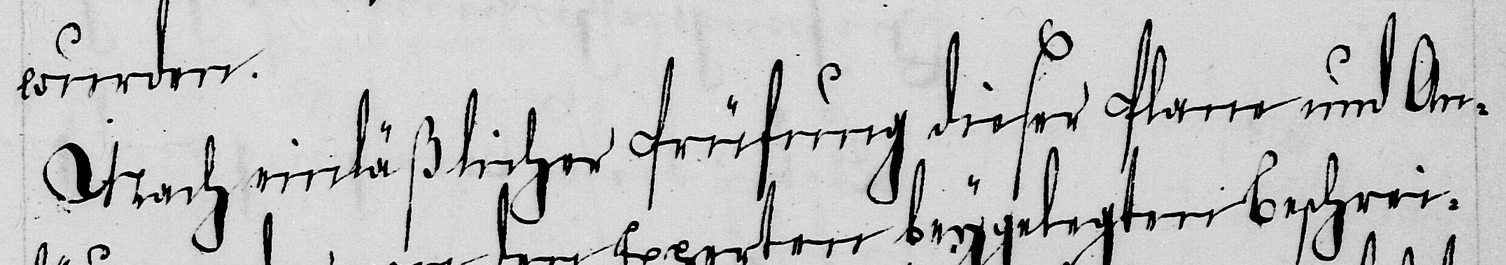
Nach einläßlicher Prüfung dieser Plane und An¬
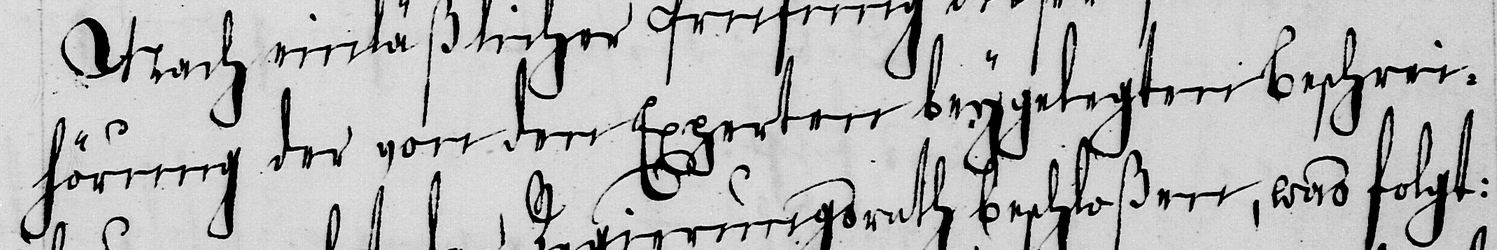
hörung der von den Experten beygelegten Beschrei¬
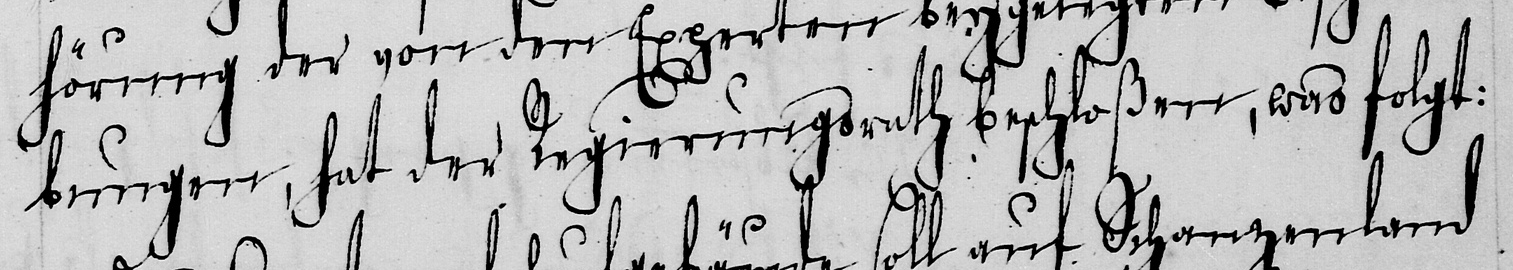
bungen, hat der Regierungsrath beschloßen, was folgt:
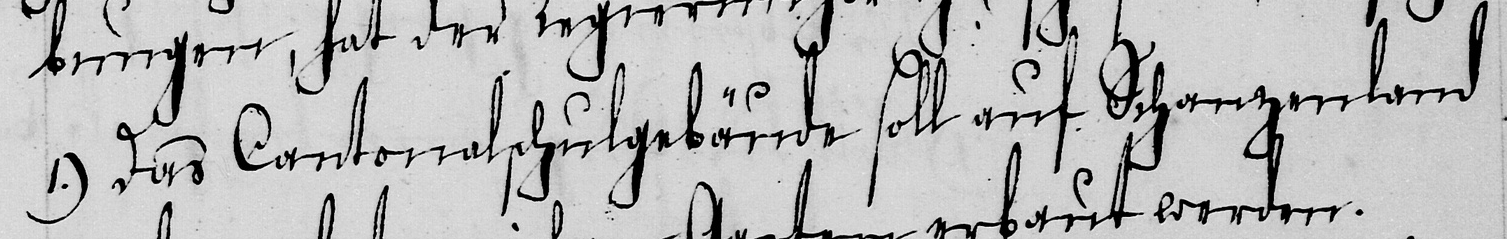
1.) Das Cantonalschulgebäude soll auf Schanzenland
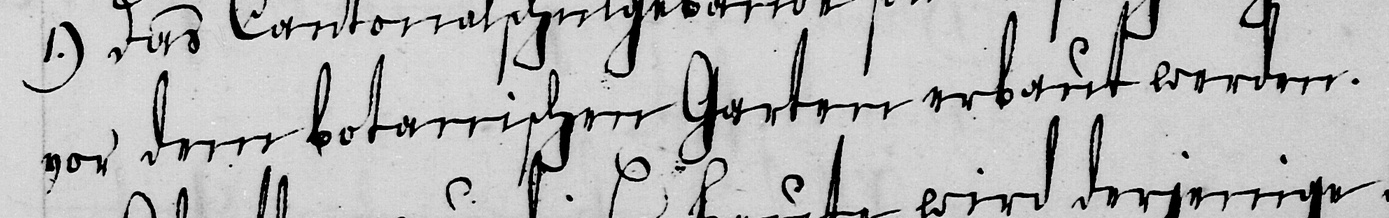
vor dem botanischen Garten erbaut werden.
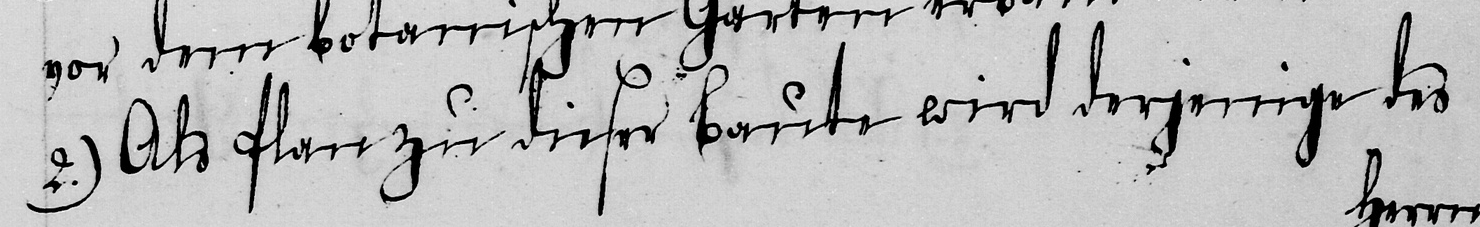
2.) Als Plan zu dieser Baute wird derjenige des
